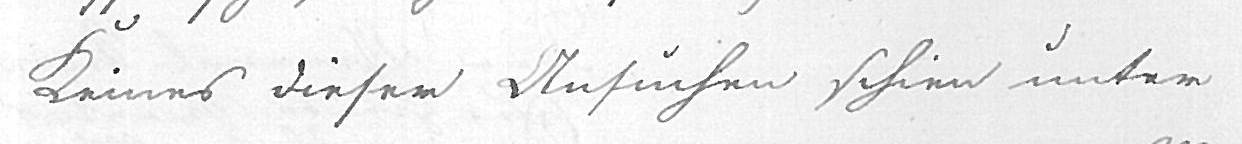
Keines dieser Ansuchen schien unter
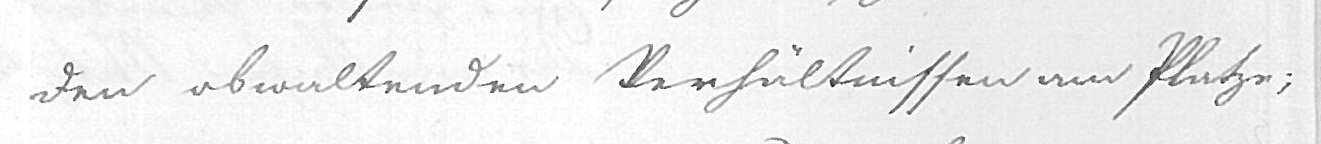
den obwaltenden Verhältnissen am Platze,
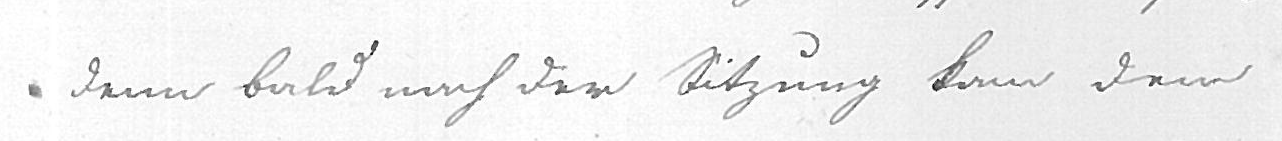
denn bald nach der Sitzung kam dem
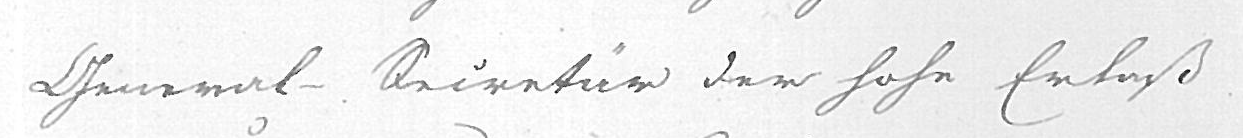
General-Secretär der hohe Erlaß
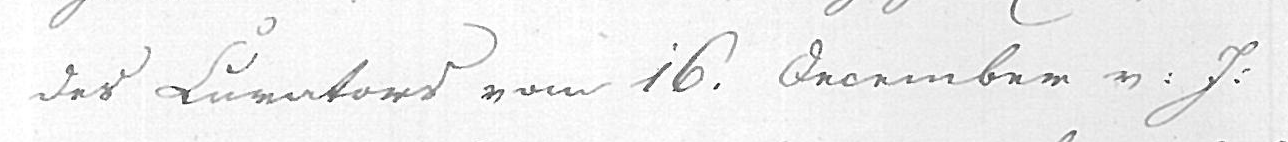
des Curators vom 16. December v. J.
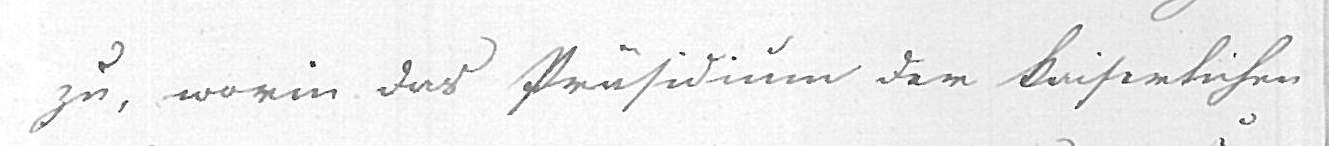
zu, worin das Präsidium der kaiserlichen
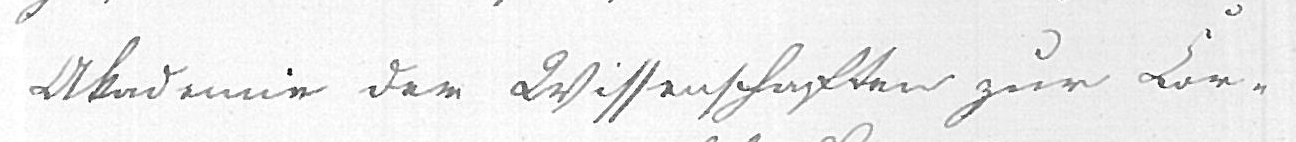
Akademie der Wissenschaften zur Cor-
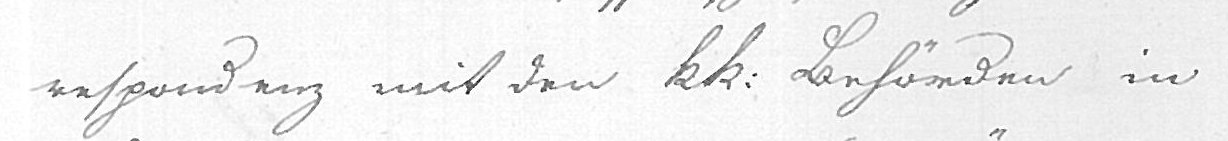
respondenz mit den kk. Behörden in
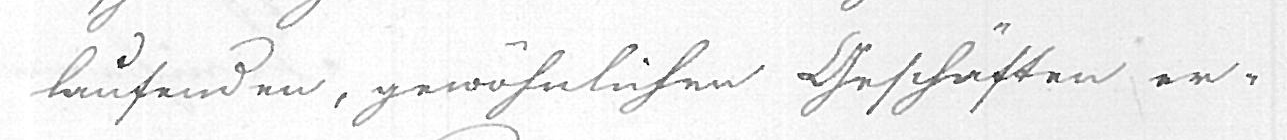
laufenden, gewöhnlichen Geschäften er-
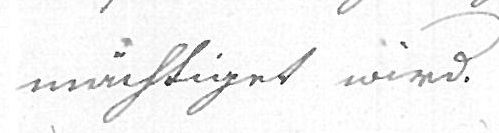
mächtiget wird.
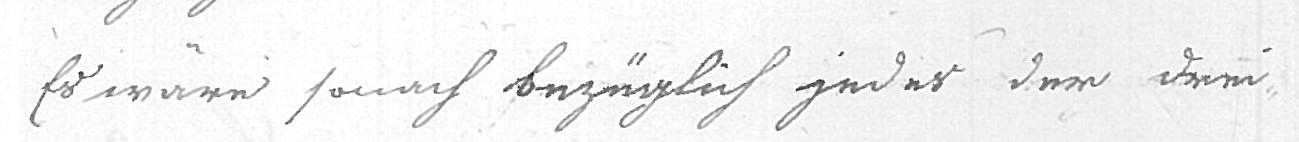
Es wäre sonach bezüglich jeder der drei
